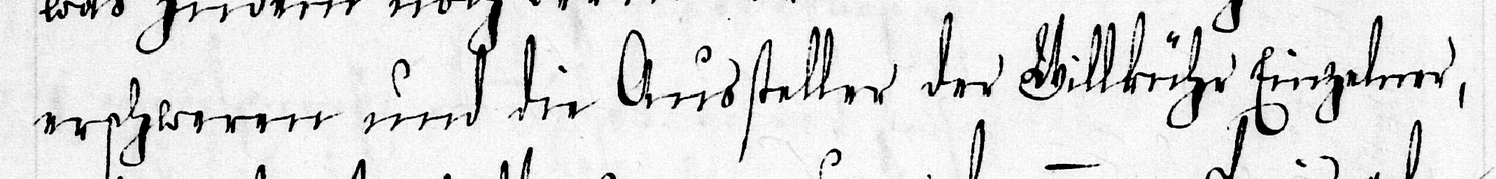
erschweren und die Aussteller der Willkühr Einzelner,
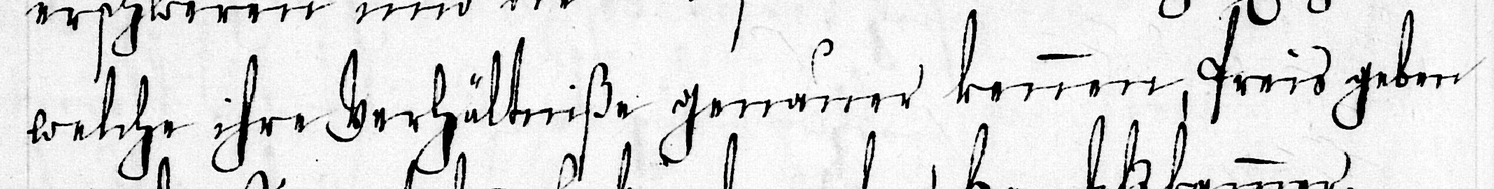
welche ihre Verhältniße genauer kennen, Preis geben
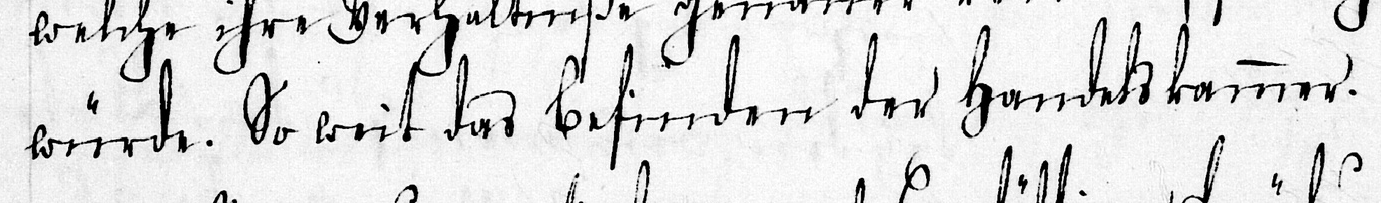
würde. So weit das Befinden der Handelskammer.
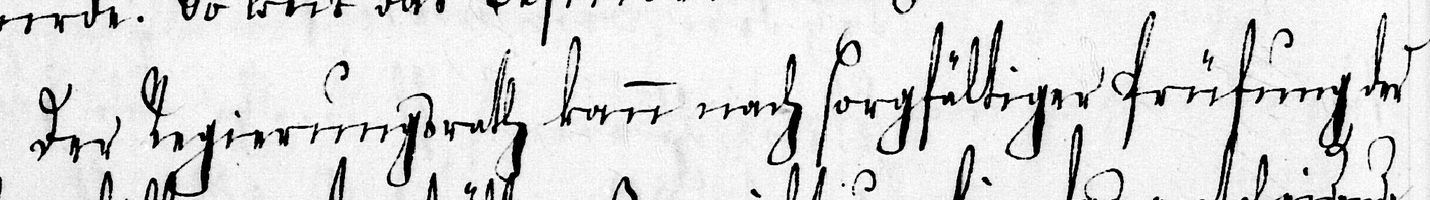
Der Regierungsrath kann nach sorgfältiger Prüfung der
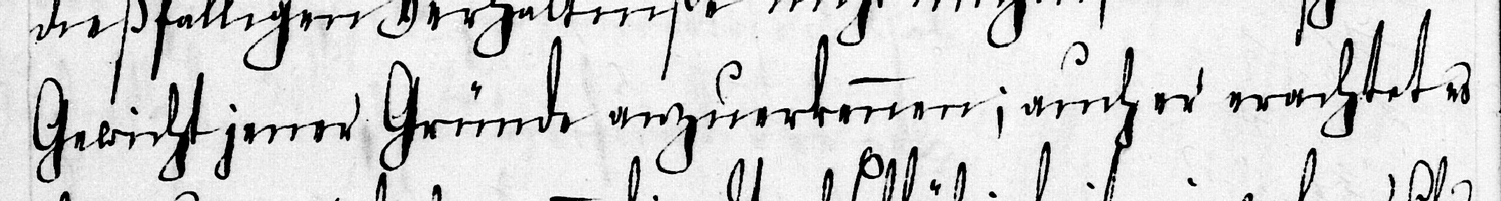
Gewicht jener Gründe anzuerkennen; auch er erachtet es
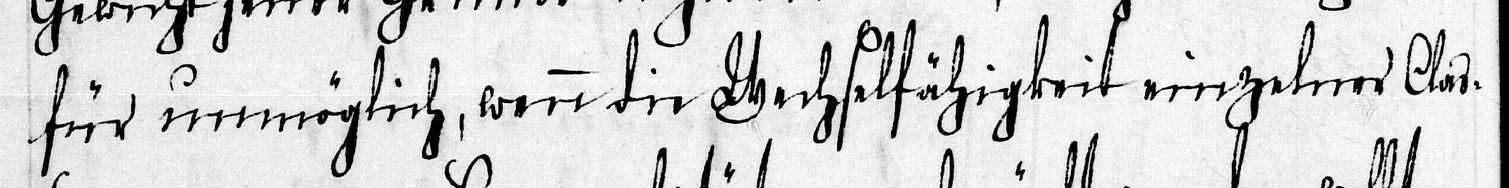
für unmöglich, wenn die Wechselfähigkeit einzelner Cla¬
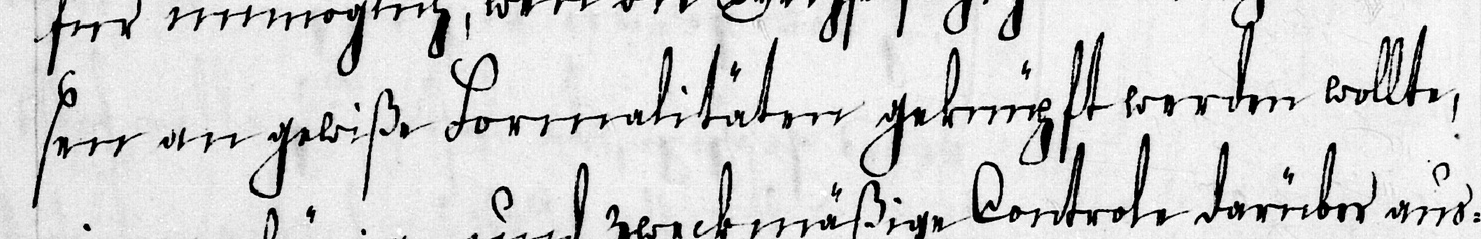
ßen an gewiße Formalitäten geknüpft werden wollte,
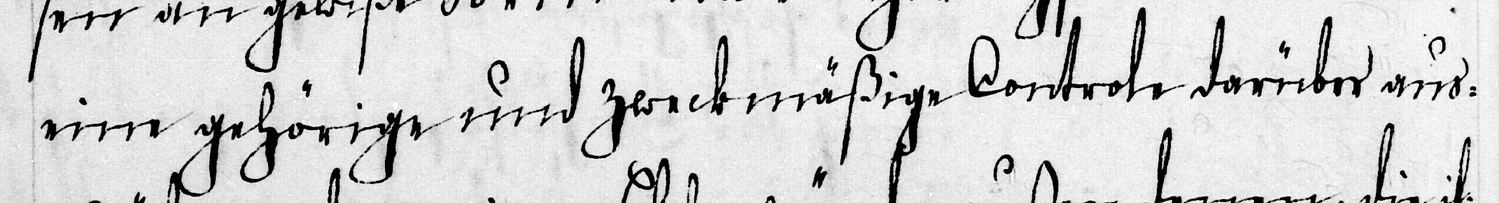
eine gehörige und zweckmäßige Controle darüber aus¬
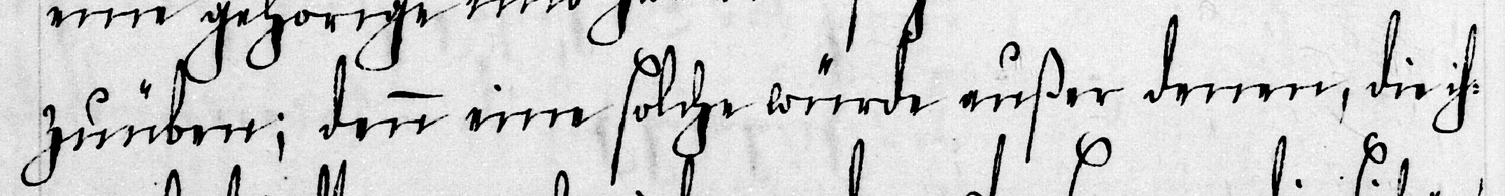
zuüben; denn eine solche würde außer denen, die i¬
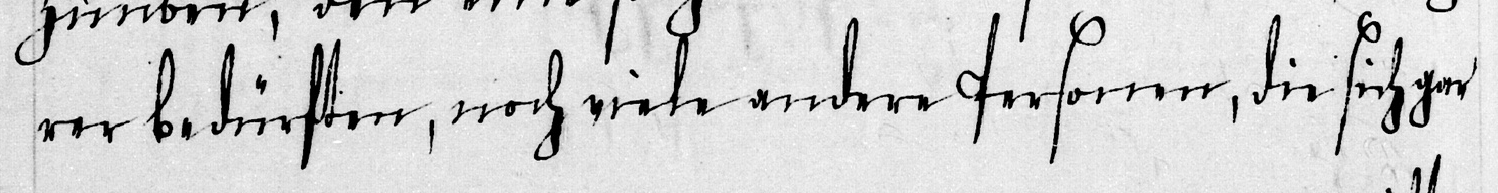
hrer bedürften, noch viele andere Personen, die sich gar
